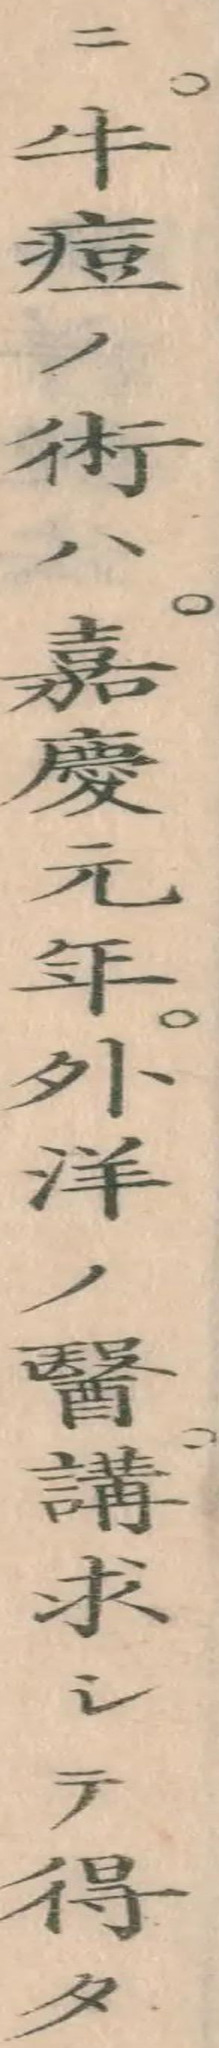ニ。牛痘ノ術ハ。嘉慶元年。外洋ノ医。講求シテ得タ
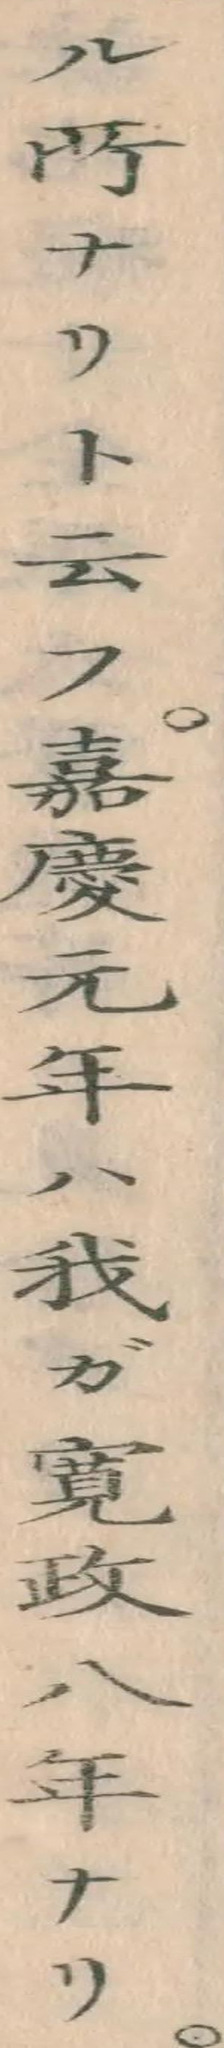ル所ナリト云フ。嘉慶元年ハ我ガ寛政八年ナリ。
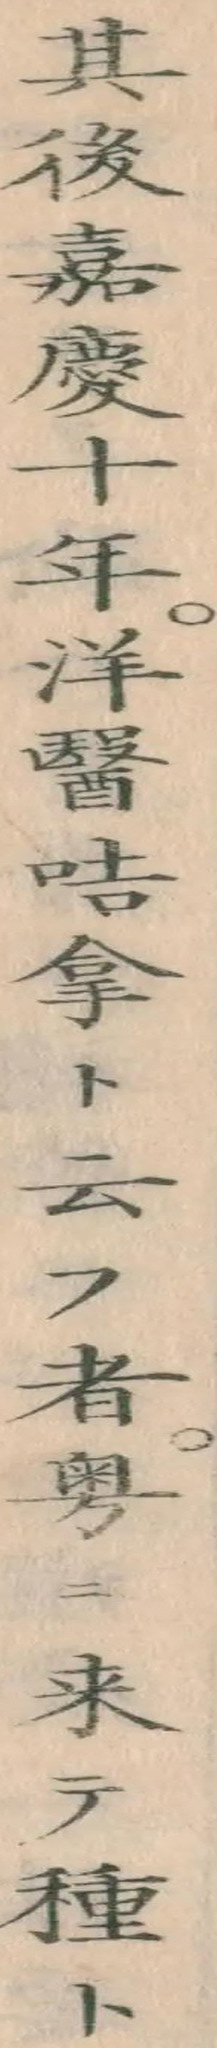其後嘉慶十年。洋医咭拿ト云フ者。粤ニ来テ種ト
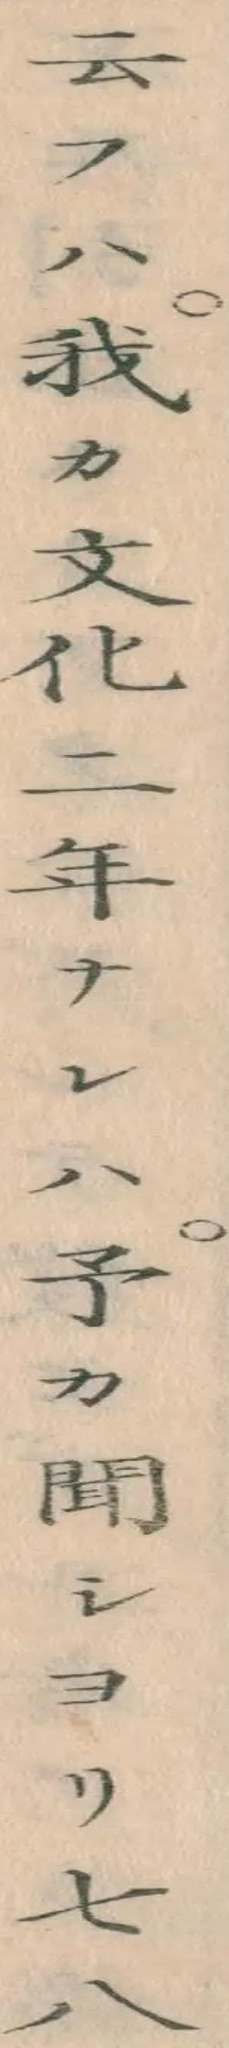云フハ。我カ文化二年ナレハ。予カ聞シヨリ七八
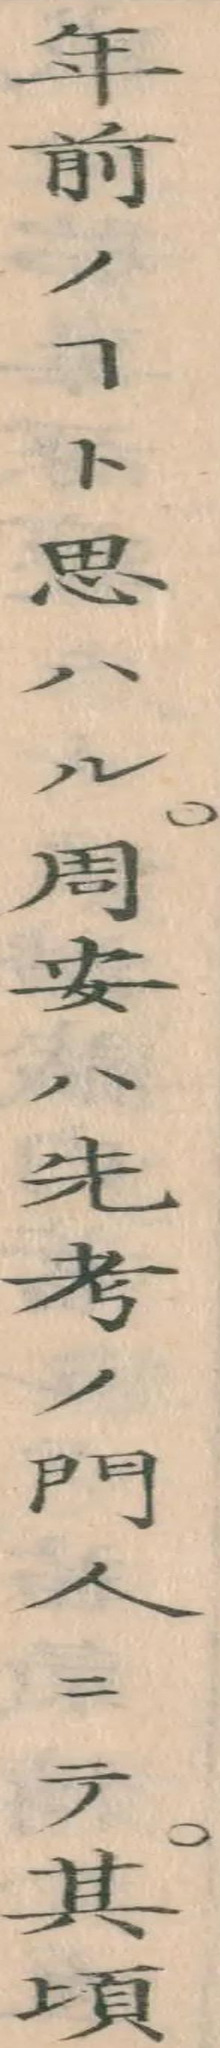年前ノヿト思ハル。周安ハ先考ノ門人ニテ。其頃
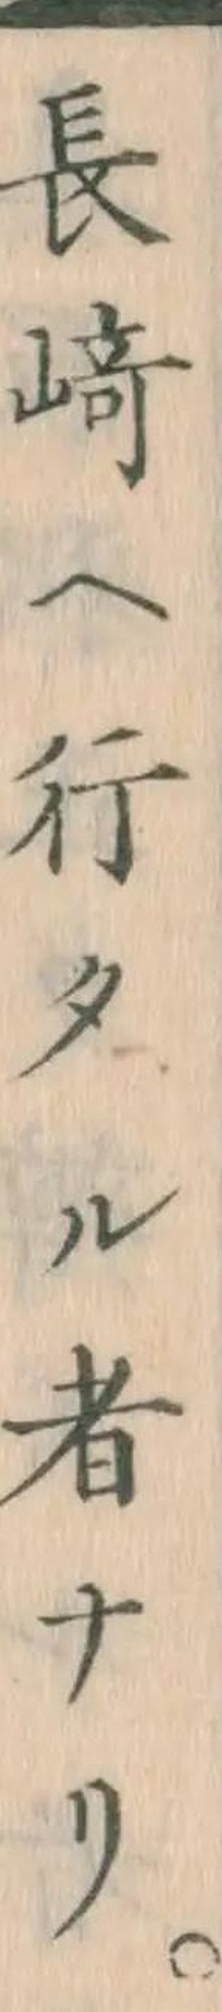長崎ヘ行キタル者ナリ
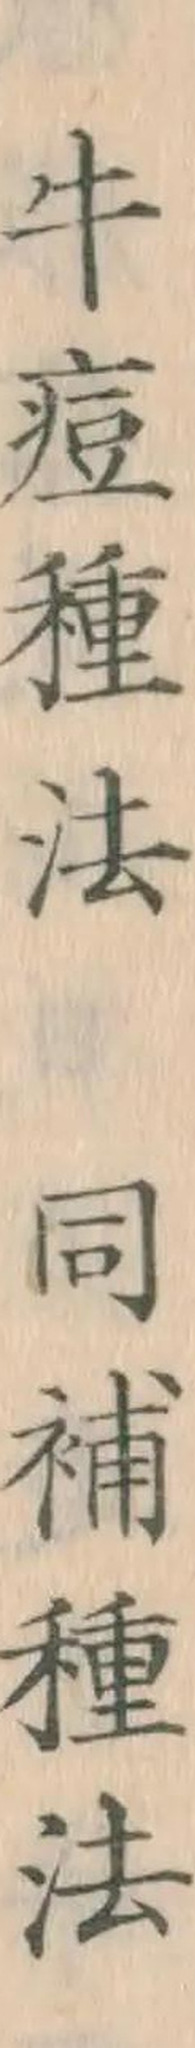牛痘種法同補種法
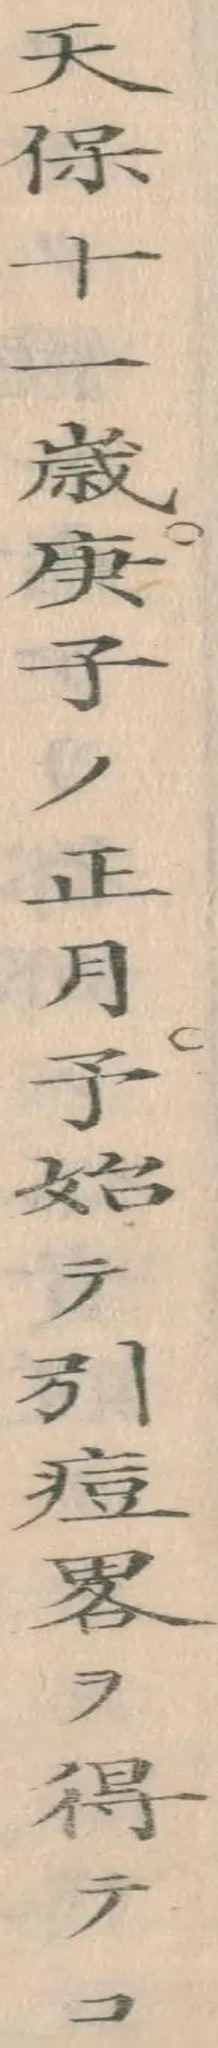天保十一歳。庚子ノ正月。予始テ引痘略ヲ得テコ
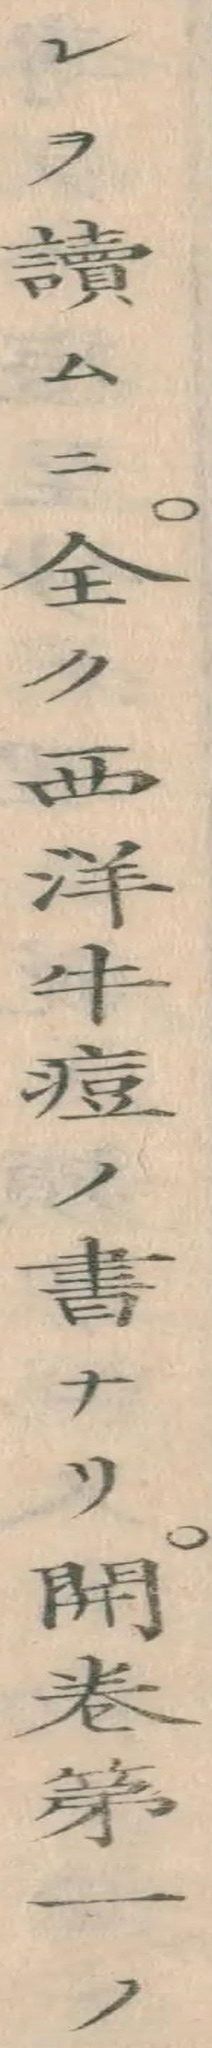レヲ読ムニ。全ク西洋牛痘ノ書ナリ。開巻第一ノ
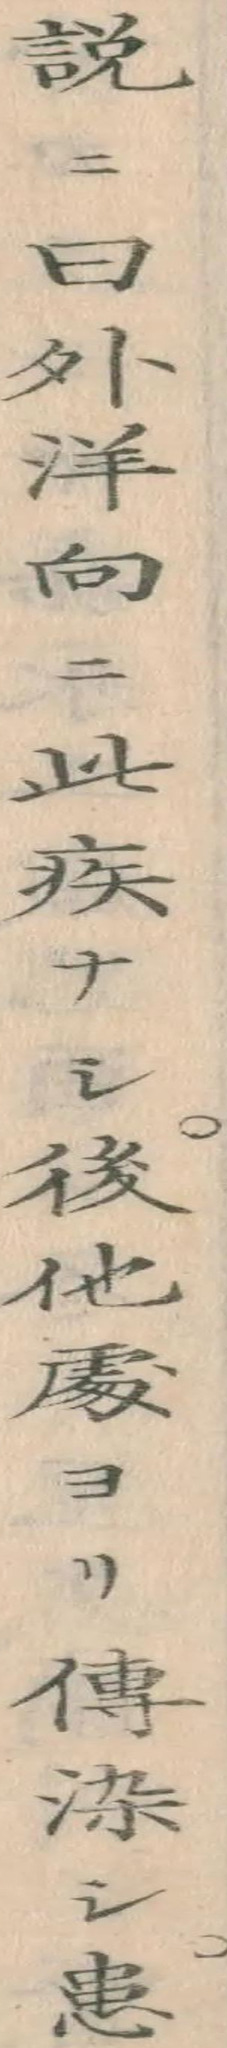説ニ曰外洋向ニ此疾ナシ。後他処ヨリ伝染シ。患
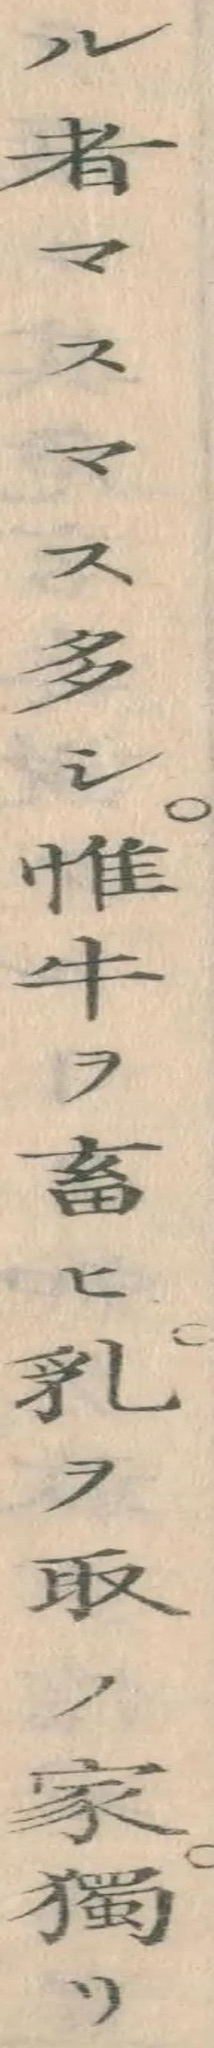ル者マスマス多シ。惟牛ヲ畜ヒ。乳ヲ取ノ家。独リ
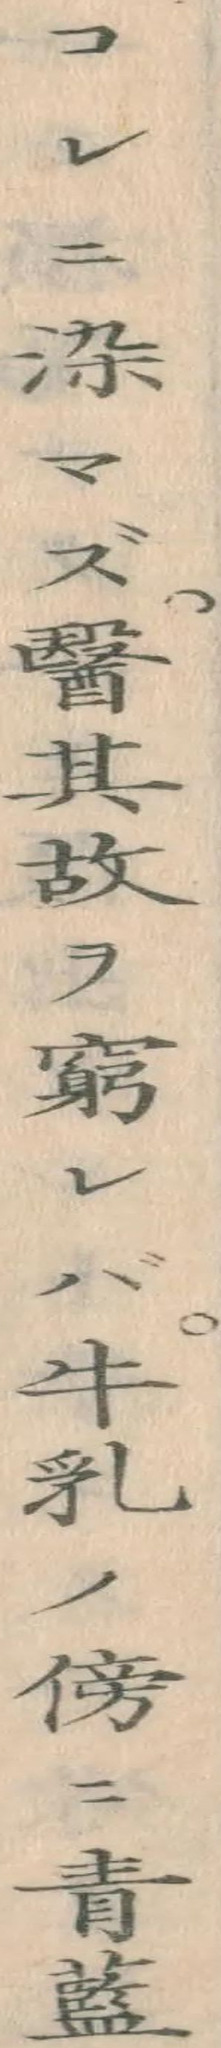コレニ染マズ。医其故ヲ窮レバ。牛乳ノ傍ニ靑藍
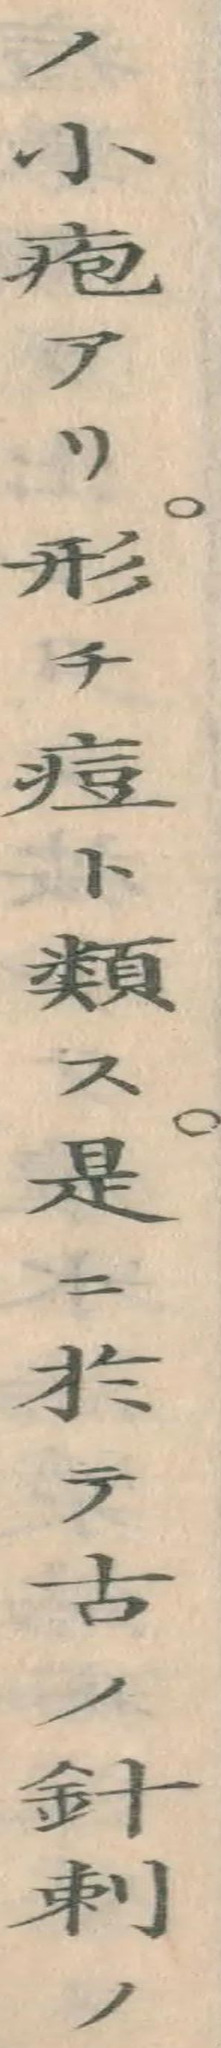ノ小疱アリ。形チ痘ト類ス。是ニ於テ古ノ針刺ノ
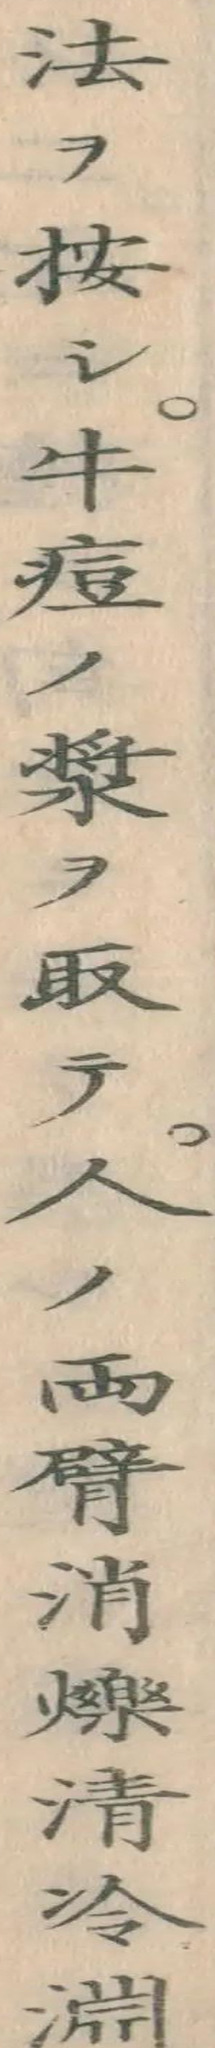法ヲ按シ。牛痘ノ漿ヲ取テ。人ノ両臂消爍清冷淵

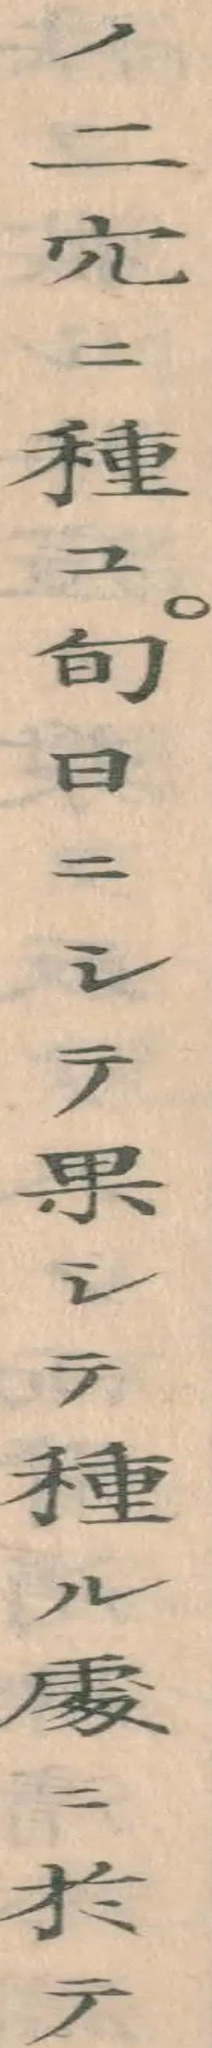ノ二穴ニ種ユ。旬日ニシテ果シテ種ル処ニ於テ
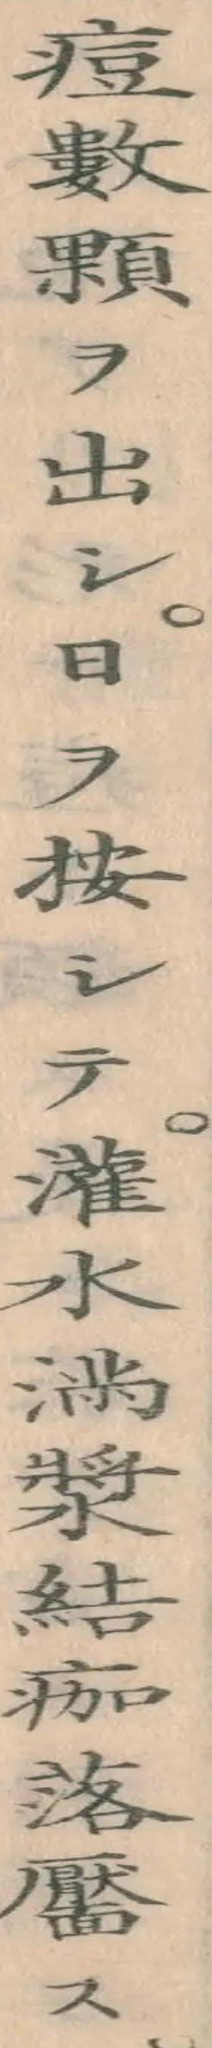痘数顆ヲ出シ。日ヲ按シテ。灌水満漿結痂落靨ス。
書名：種痘弁義
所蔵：国立国会図書館 National Diet Library, JAPAN
